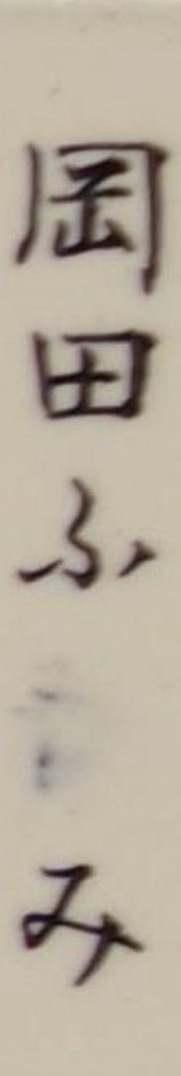岡田ふみ
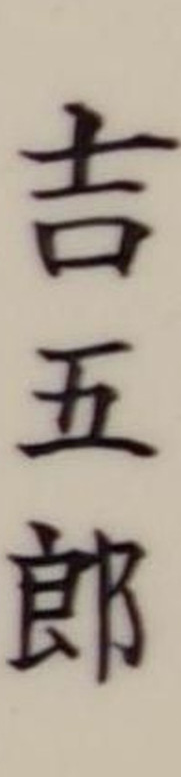吉五郎
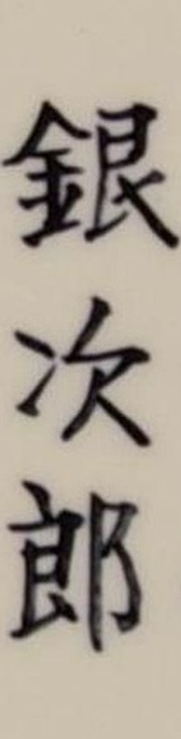銀次郎
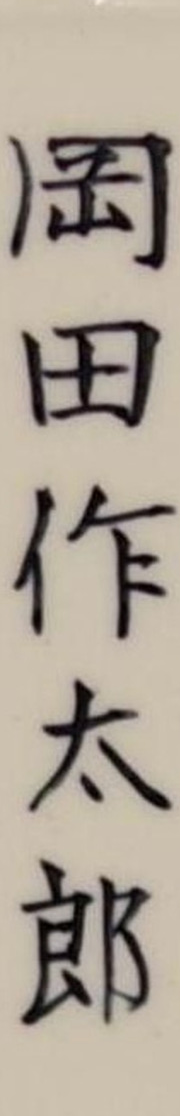岡田作太郎
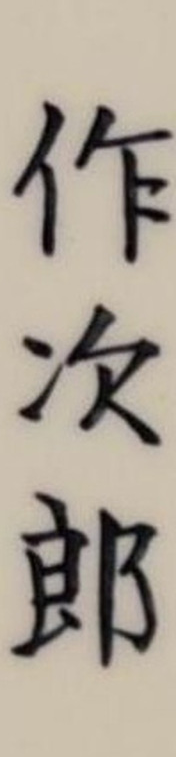作次郎
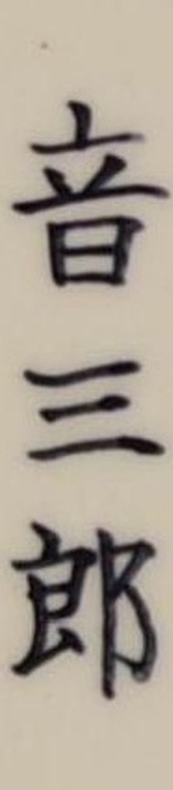音三郎
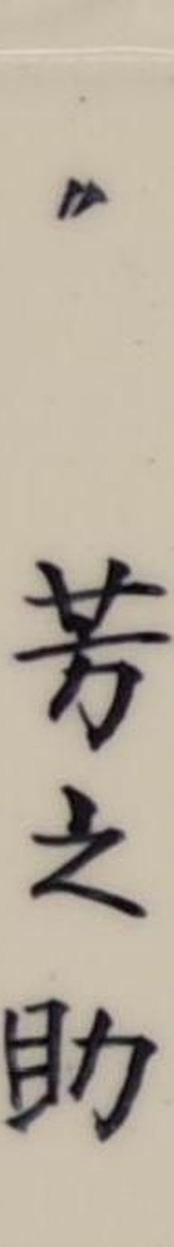芳之助
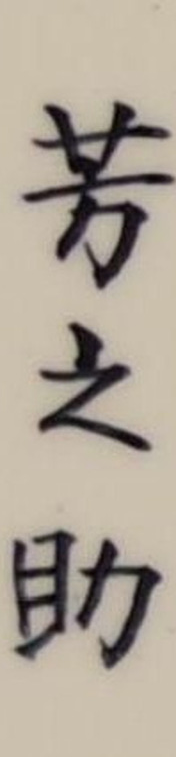芳之助
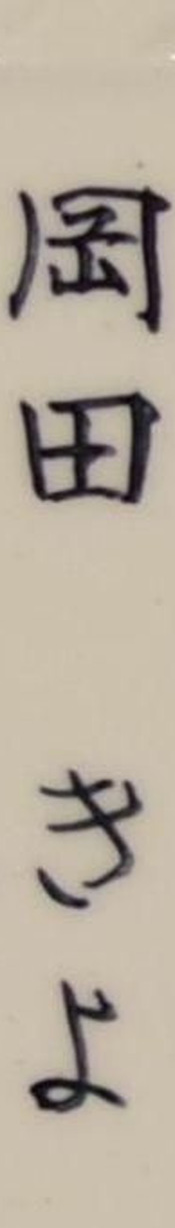岡田きよ
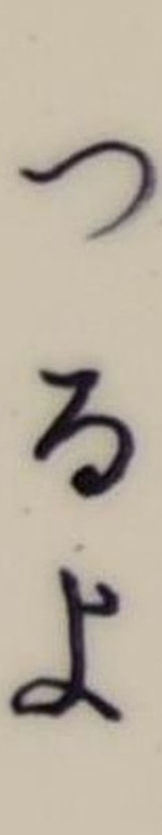つるよ

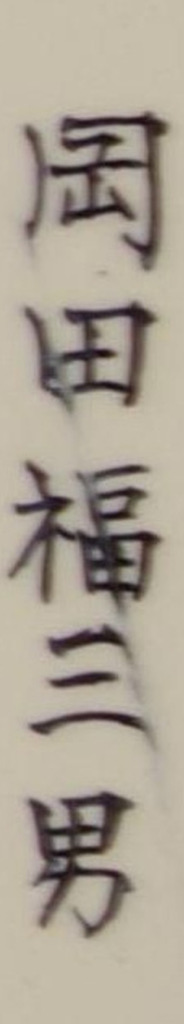岡田福三男
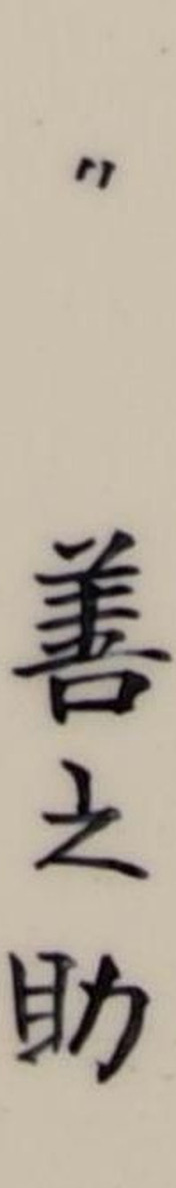善之助
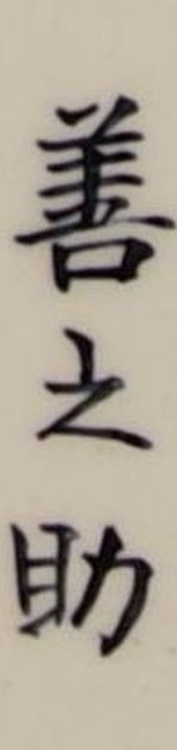善之助
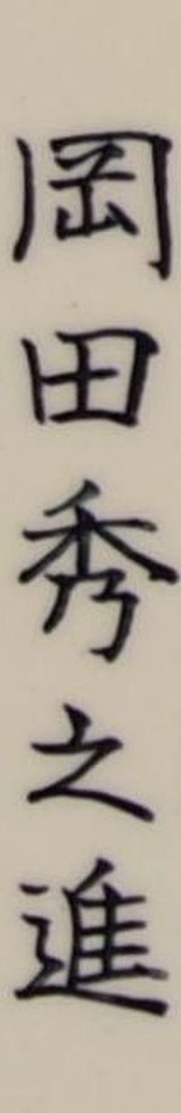岡田秀之進
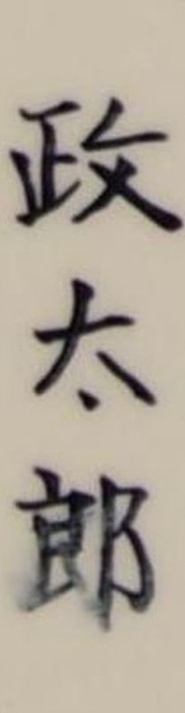政太郎
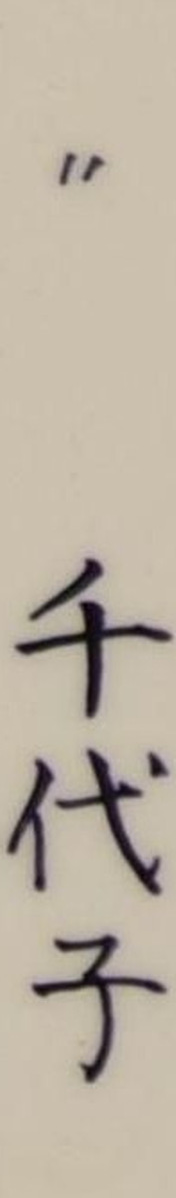千代子
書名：E~L
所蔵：高野山金剛峯寺
